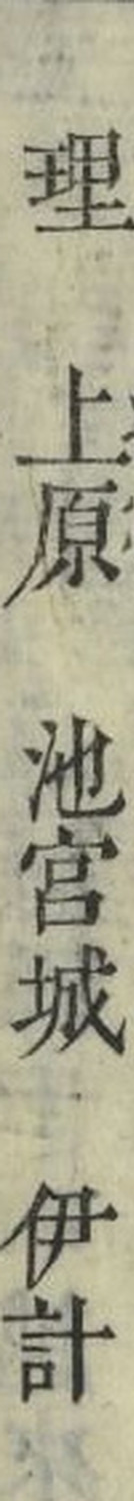理上原池宮城伊計

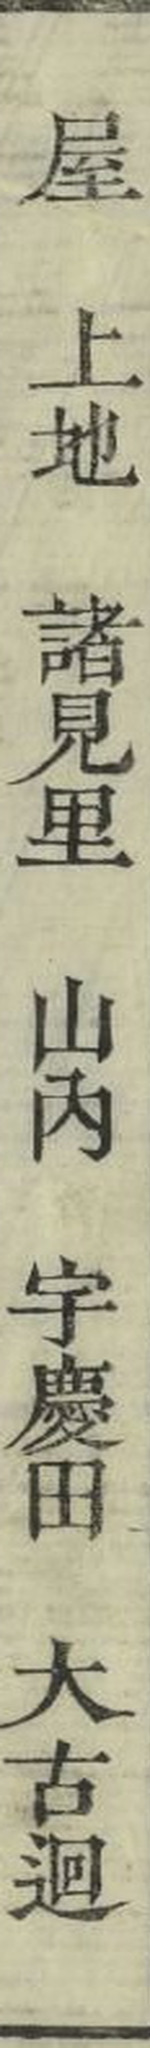屋上地諸見里山内宇慶田大古迴
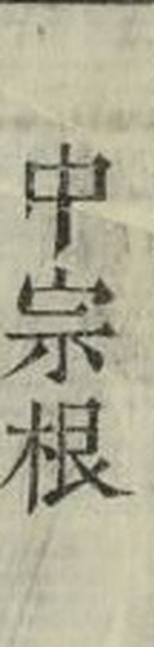中宗根
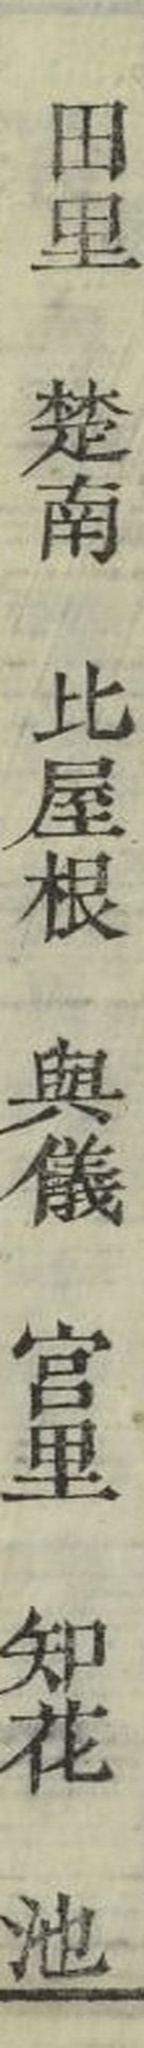田里楚南比屋根与儀宮里知花池
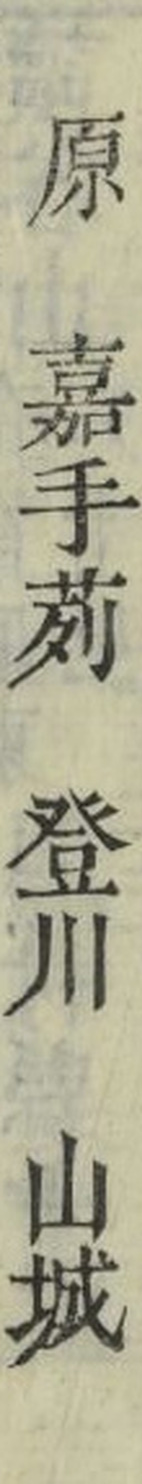原嘉手茢登川山城
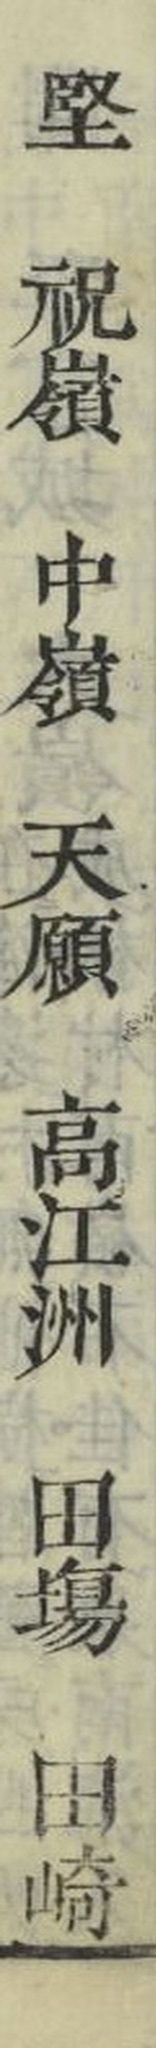堅祝嶺中嶺天願高江洲田場田崎
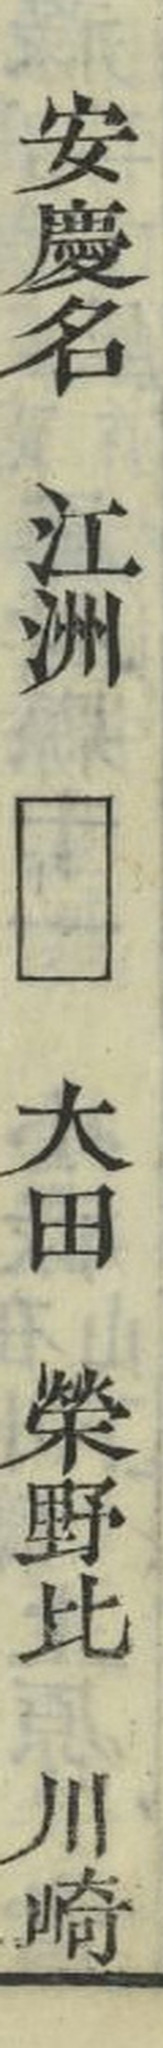安慶名江洲大田栄野比川崎
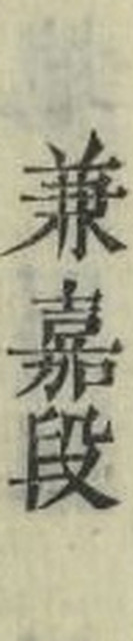兼嘉段
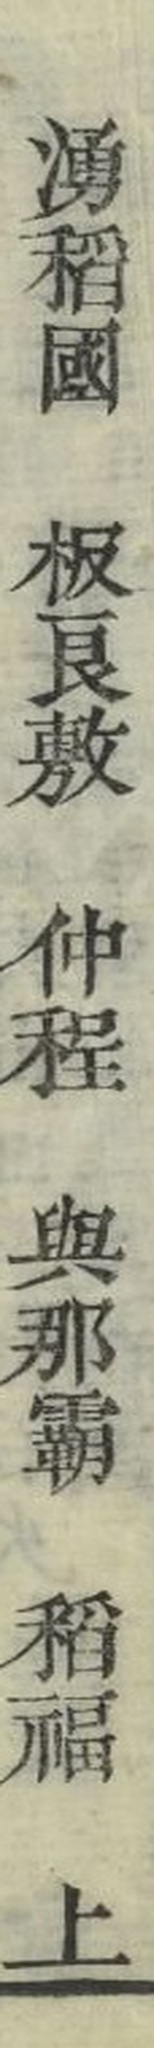湧稲国板良敷仲程与那覇稲福上
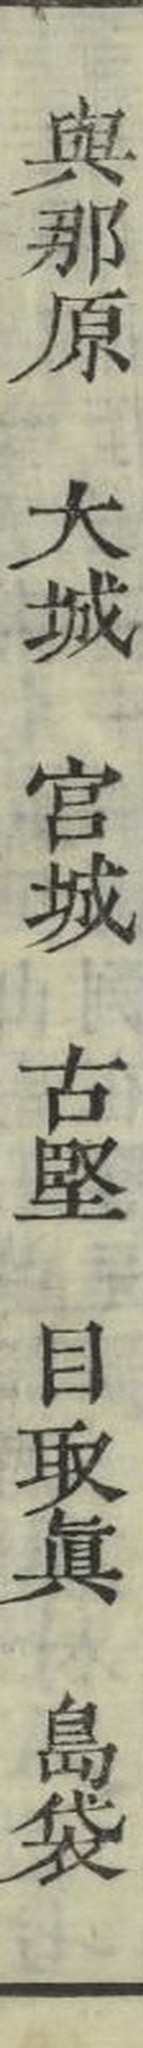与那原大城宮城古堅目取真島袋
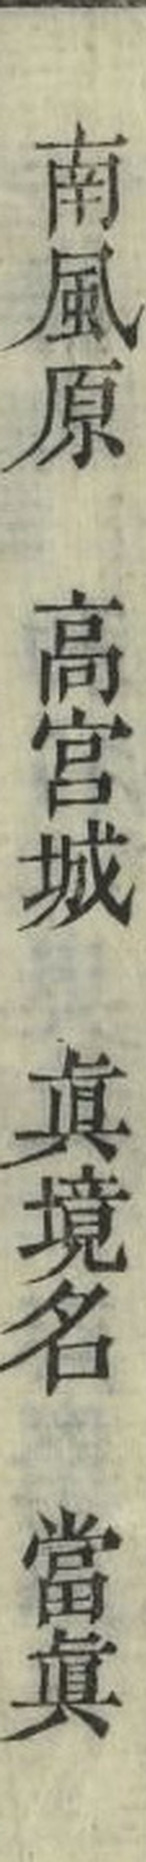南風原高宮城真境名当真

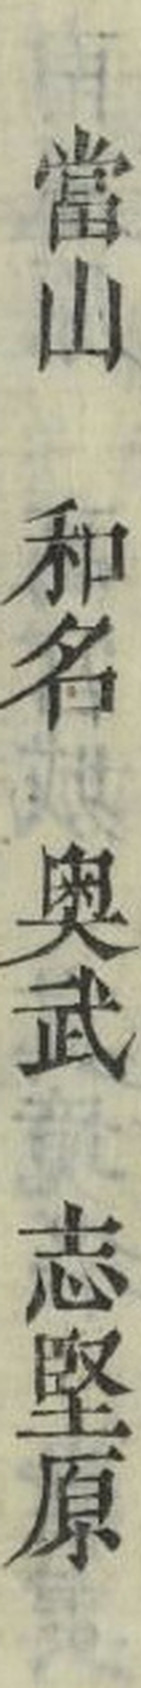当山和名奥武志堅原
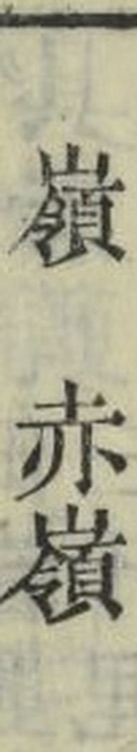嶺赤嶺

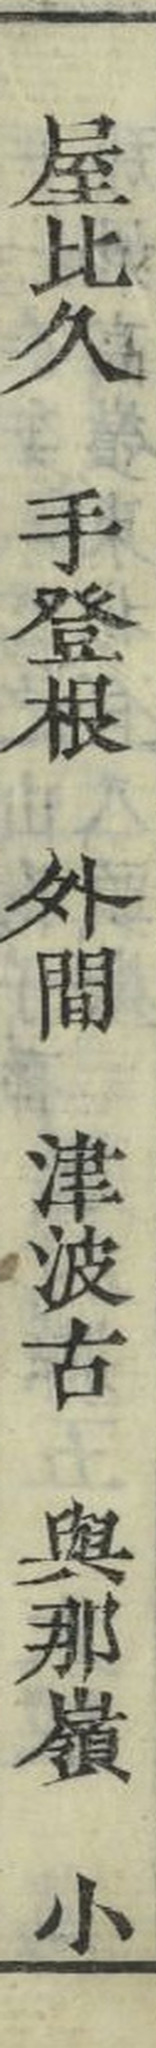屋比久手登根外間津波古与那嶺小
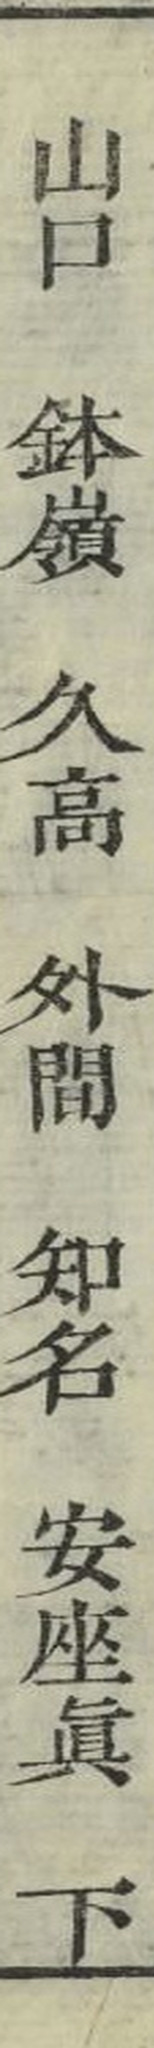山口鉢嶺久高外間知名安座真下
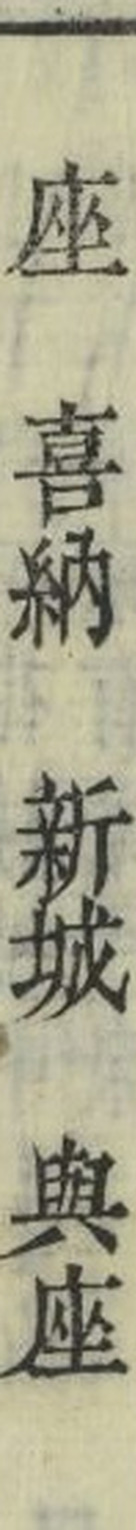座喜納新城与座
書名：中山伝信録 巻四
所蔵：University of the Ryukyus Library
